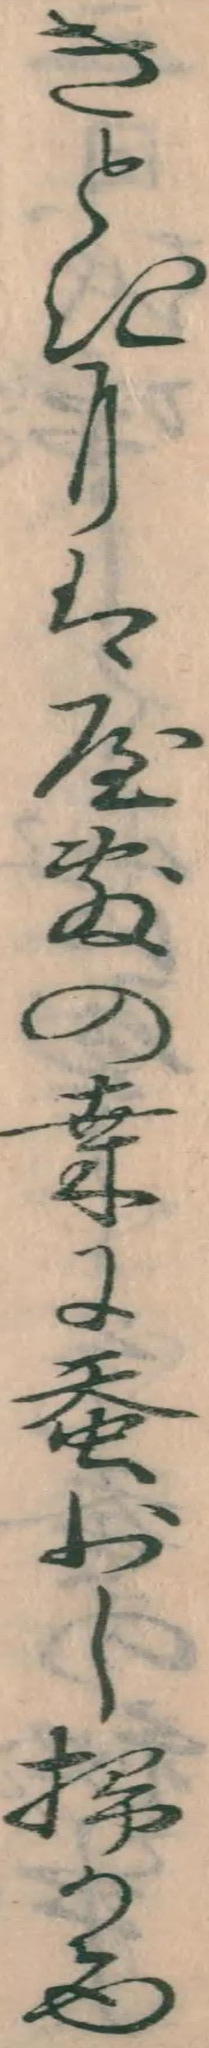きときには屋敷の桑に蚕少し掃かけ
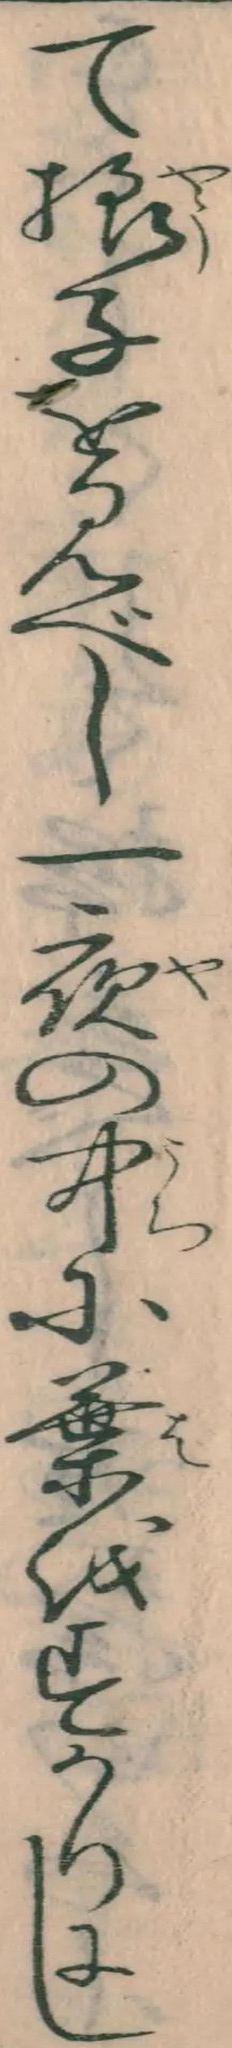て様子を見べし一夜の中に葉をすかりにし
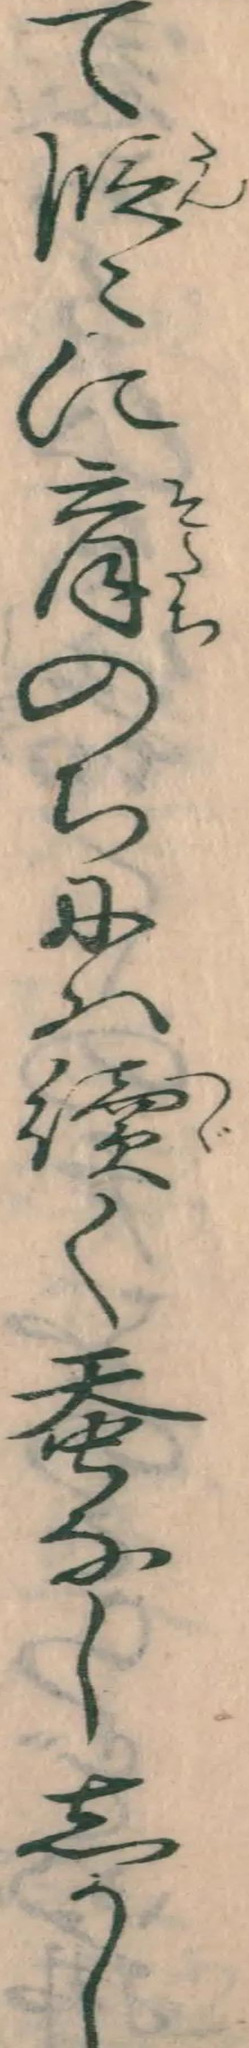て段々に育のちには続く蚕なししかし
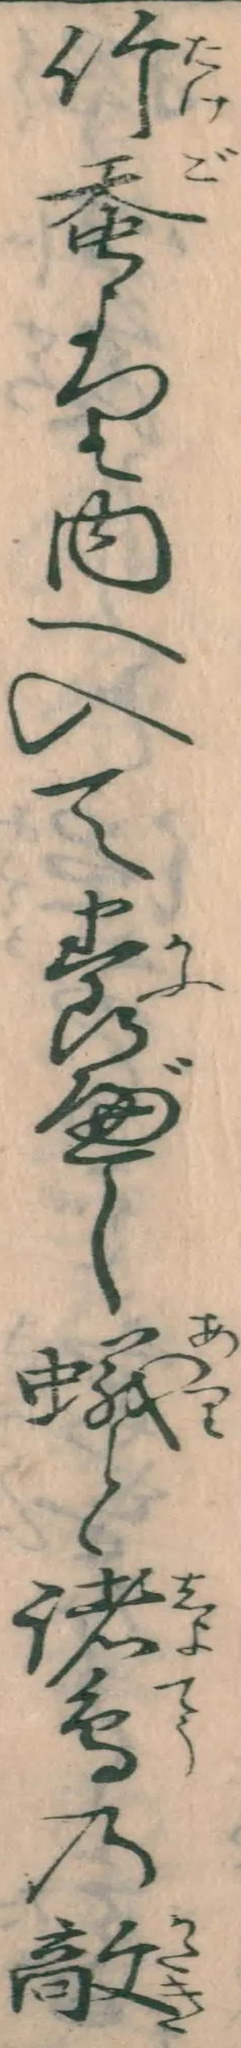竹蚕より内へ入て養べし蟻と諸鳥の敵
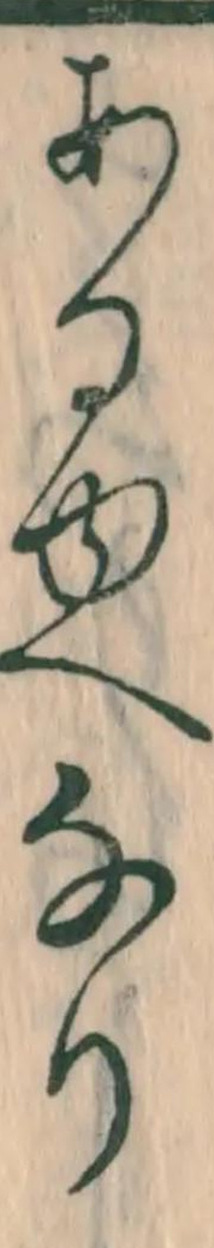あるゆへなり
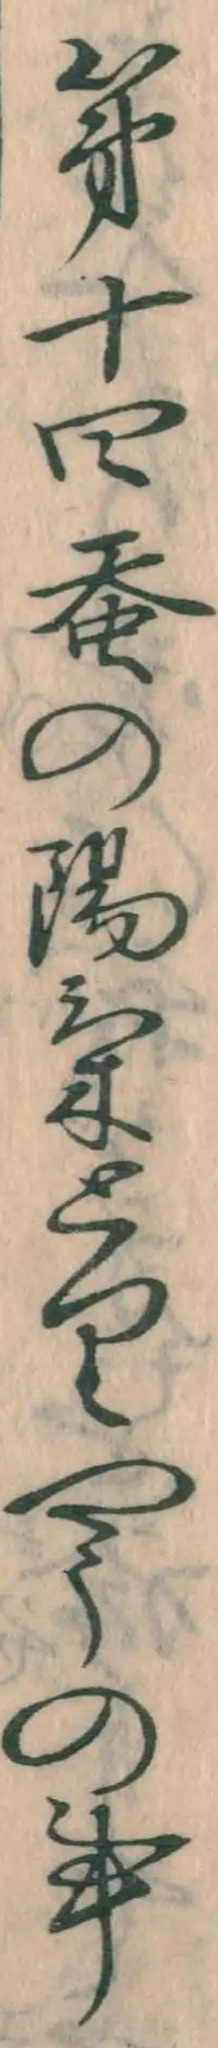第十四蚕の陽気とりやうの事

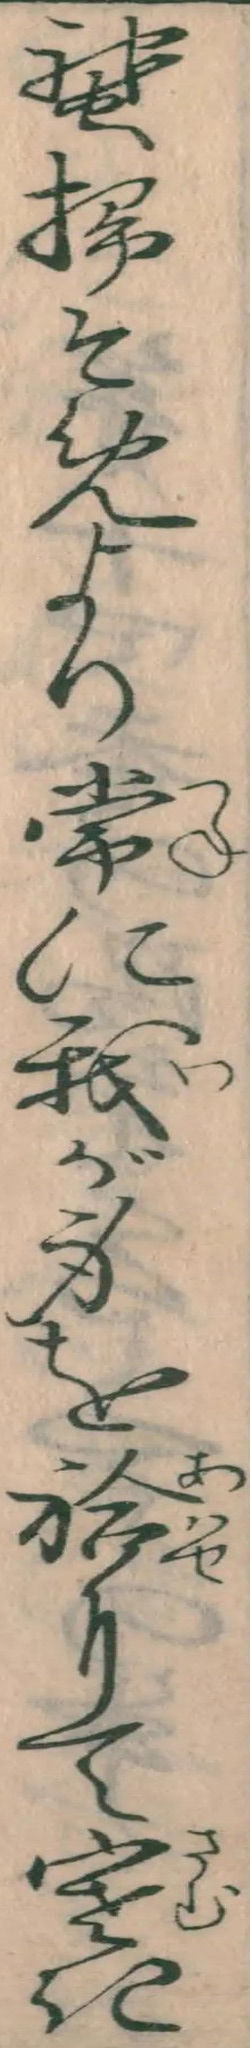䗝掃そめより常に我が身を袷にて寒き
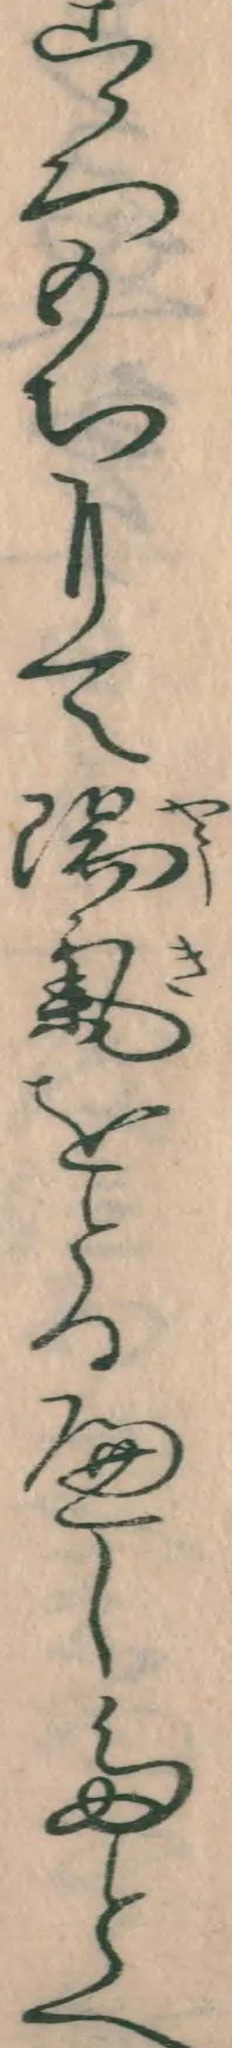こゝろもちにて陽気をとるへしたとへ
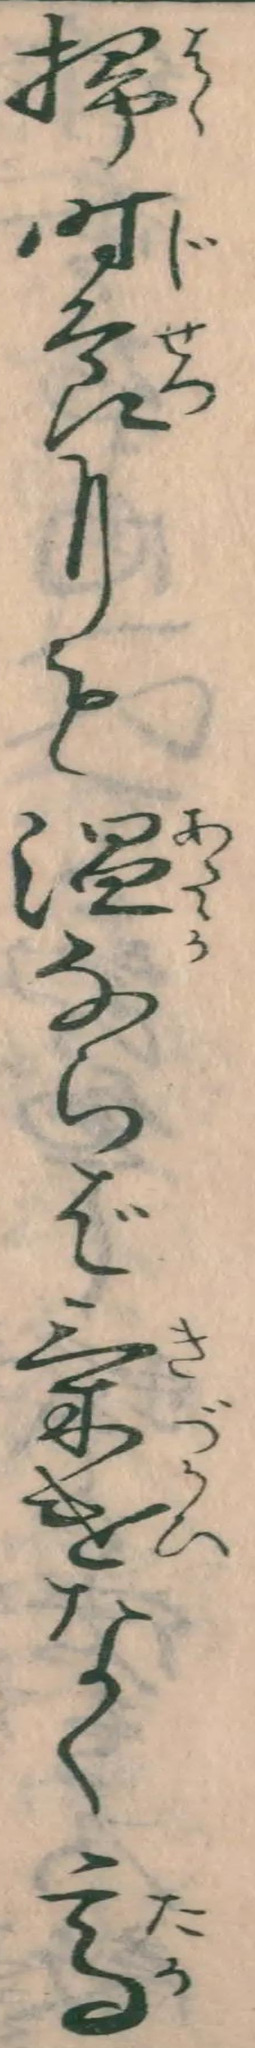掃時節にも温ならば気遣なく高
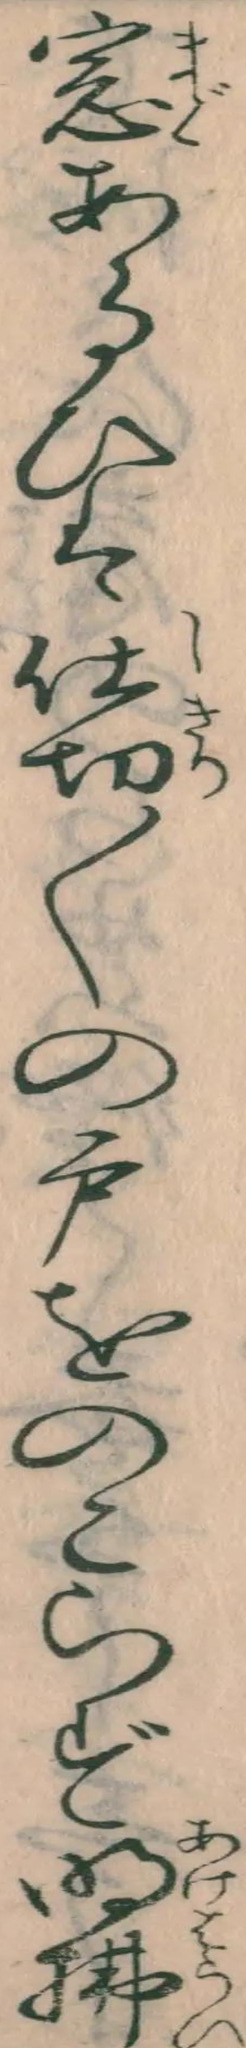窓あるひは仕切〳〵の戸をのこらず明払
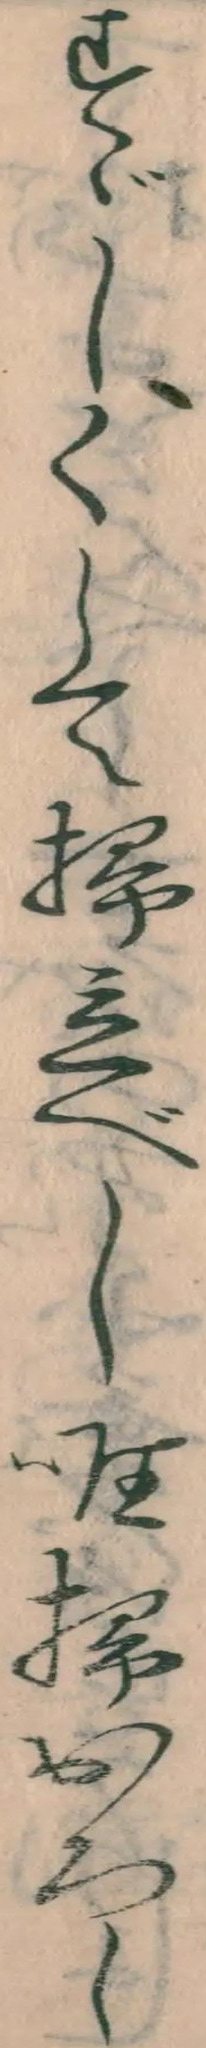すゞしくして掃立べし唯掃おろし
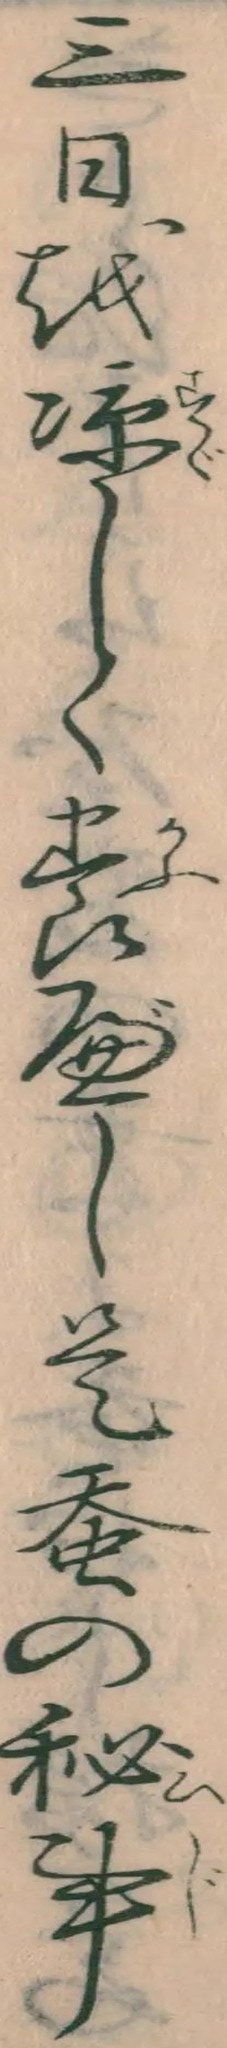三日を涼しく養べし是蚕の秘事
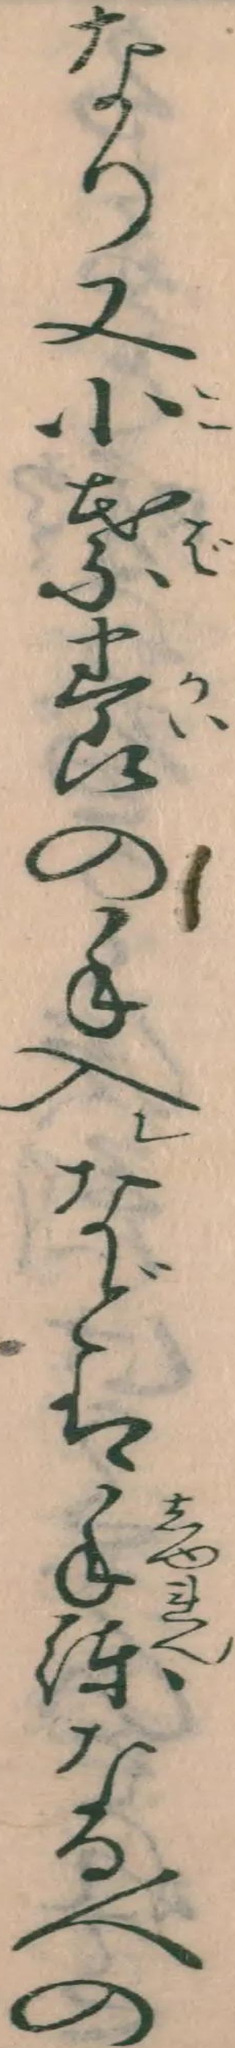なり又小葉養の手入れなどは手練なる人の
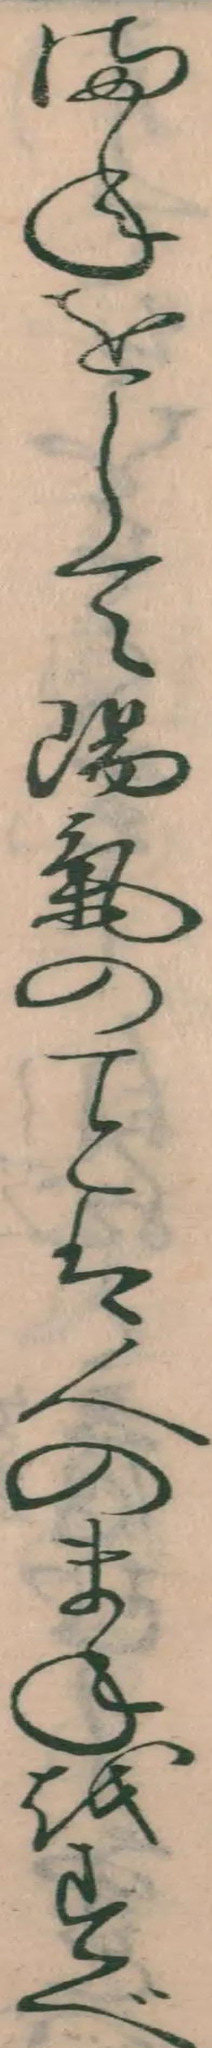まねをして陽気のことは人のまねをすべ
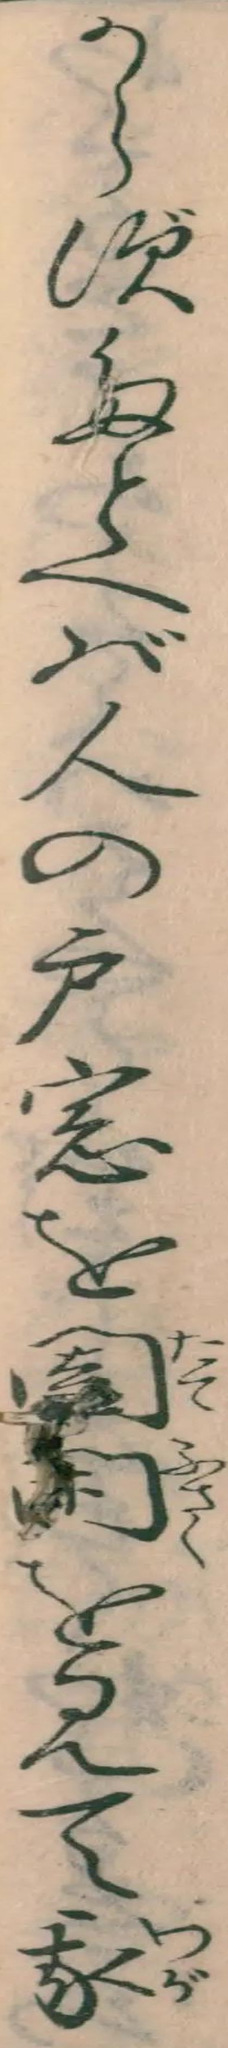からずたとへば人の戸窓を闔閑を見て我
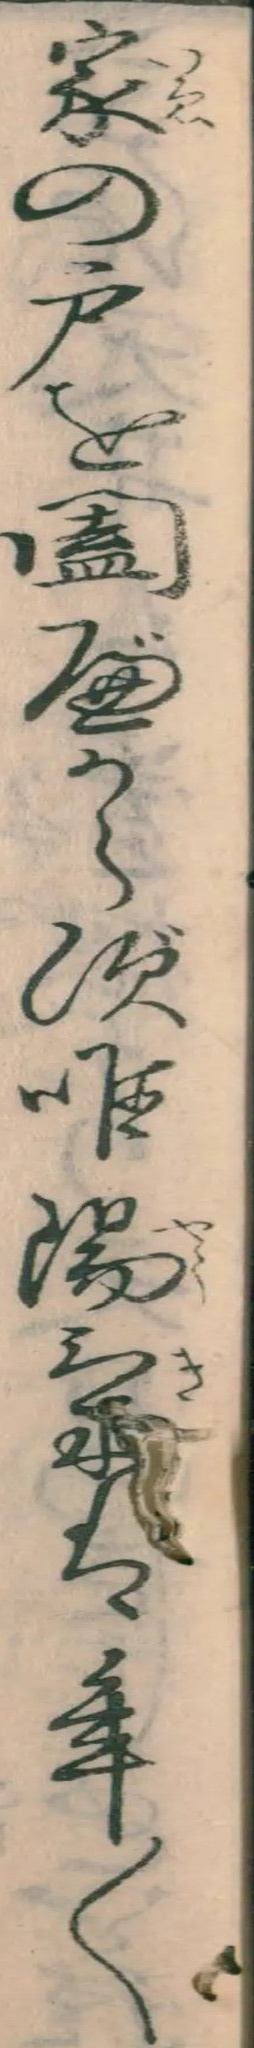家の戸を闔べからず唯陽気は年〳〵
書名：新撰養蚕秘書
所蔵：国立国会図書館 National Diet Library, JAPAN
